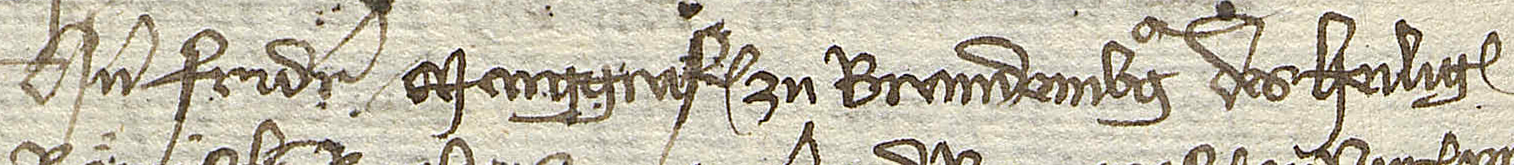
H*n* fridr* Marggraf ʒu Brandembg* des heilig*
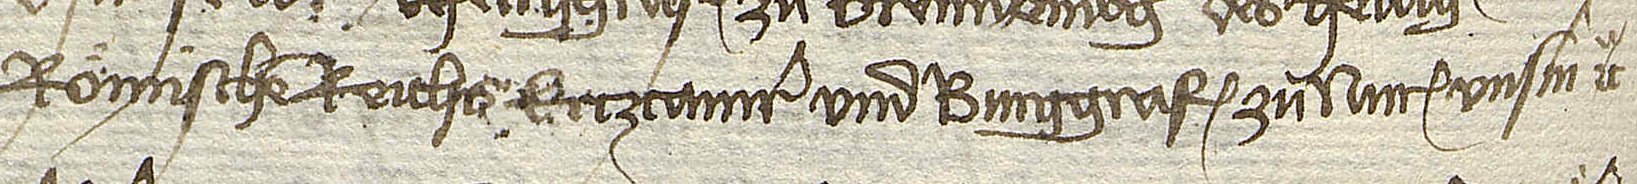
Römiſche* Reichs Ercʒcamr* vnd Burggraf* ʒu Nur* vnſ*m ec*
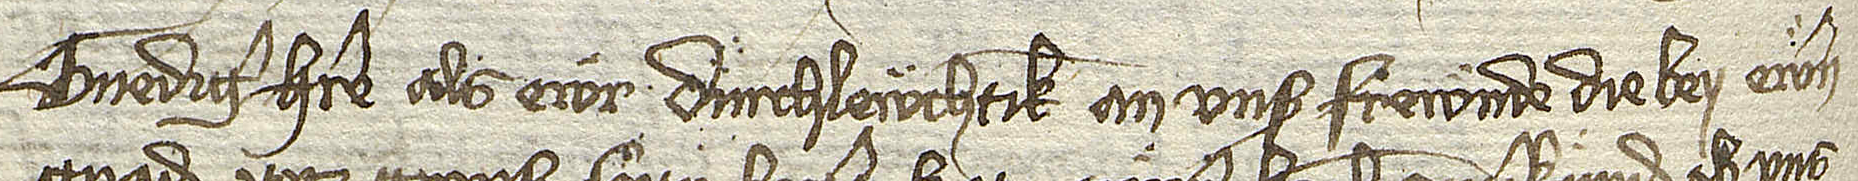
Gnedig* h*re als ewr durchlewchtik* an vnſ* frewnde die bey ew*n
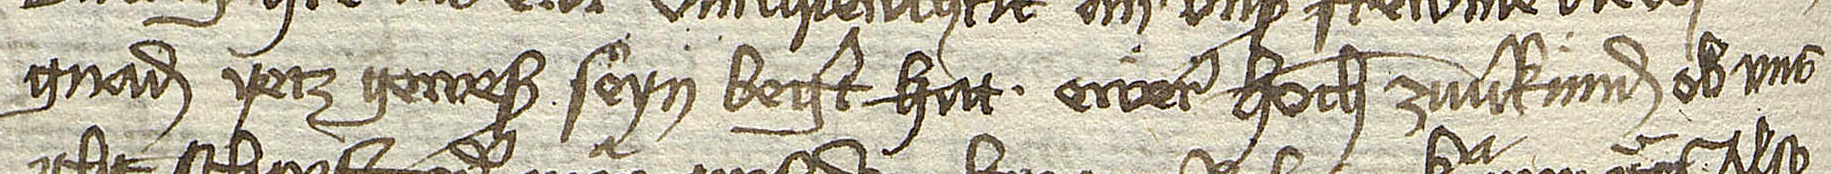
gnad* yecʒ geweſ* ſeyn beg*t hat . ewer* hoch* ʒuu*künd* ob vns
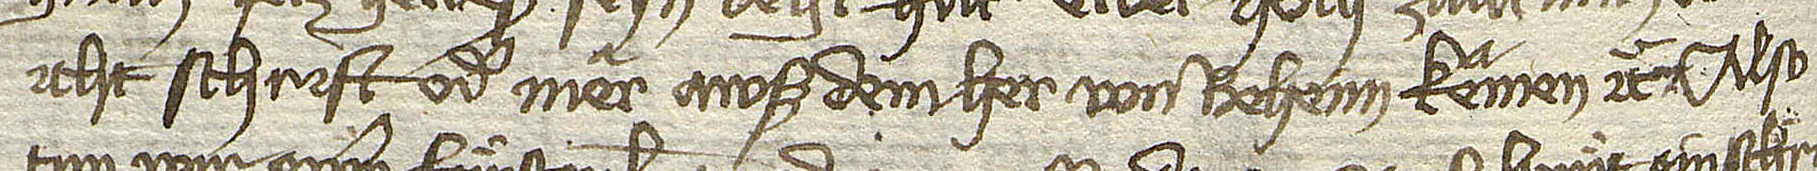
icht ſchrift od* mër awſʒ dem her von Beheim këmen ec* Alſo
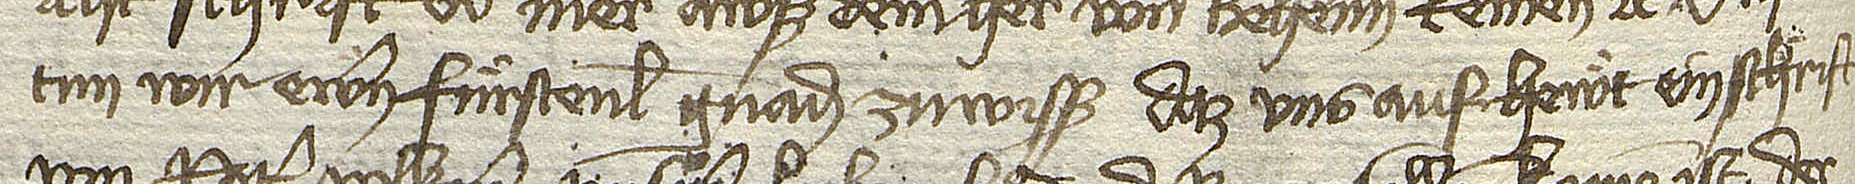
tun wir ew*n fürſtenl* gnad* ʒuwiſſ* daʒ vns auf hewt ein ſchrift
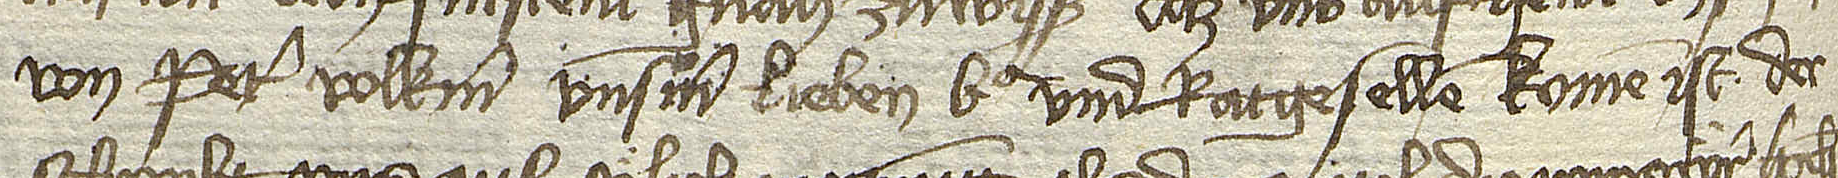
von Pet* volkm* vnſ*m lieben b* vnd Ratgeſelle* kome* iſt . der
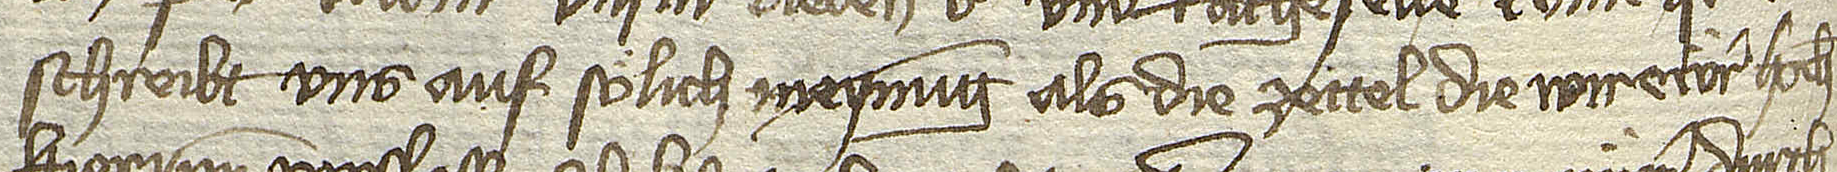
ſchreibt vns auf ſölich meynug* als die ʒettel die von ew*r hoch*
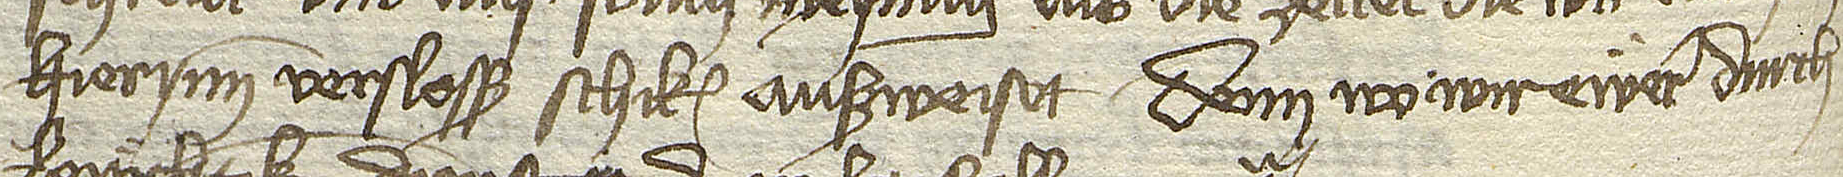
hierynn* verſloſſ* ſchik* auſʒweiſet / Denn wo wir ewer* durch
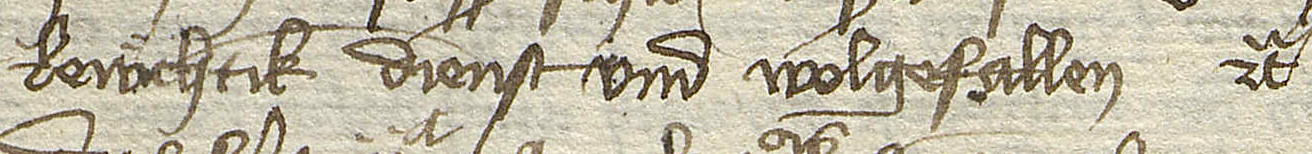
lewchtik* dienſt vnd wolgefallen ec*
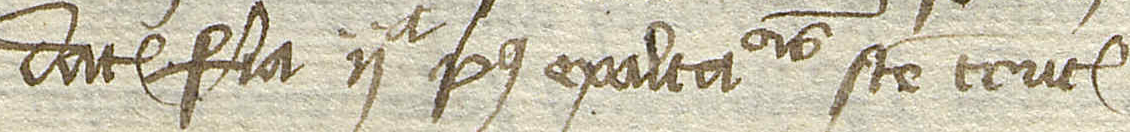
Dat* fia* ii* p* exalta* ſte* cruc* .
